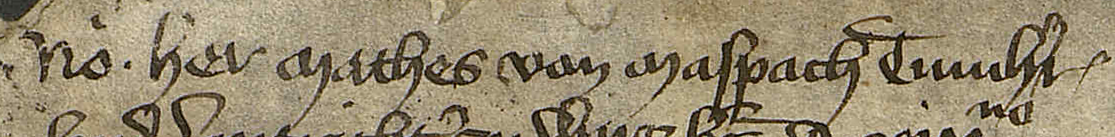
Nö . her mathes von maſpach Tumh*
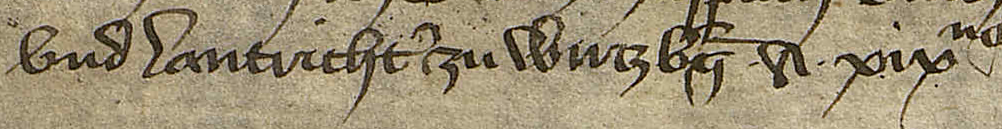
Vnd lantricht* ʒu Wircʒb*g . A . pi*
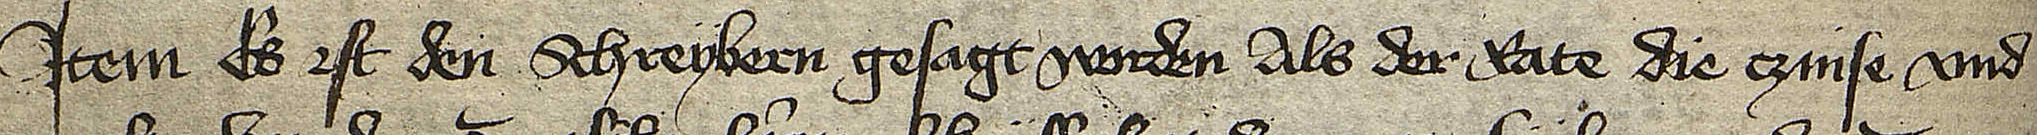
Item Es iſt den Schreybern geſagt worden Als der Rate die cʒinſe vnd
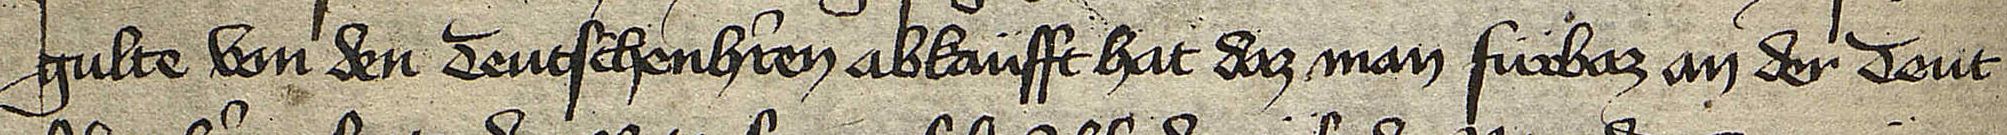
gulte Von den Teutſchenh*ren abkaüfft hat daʒ man fürbaʒ an der Teut
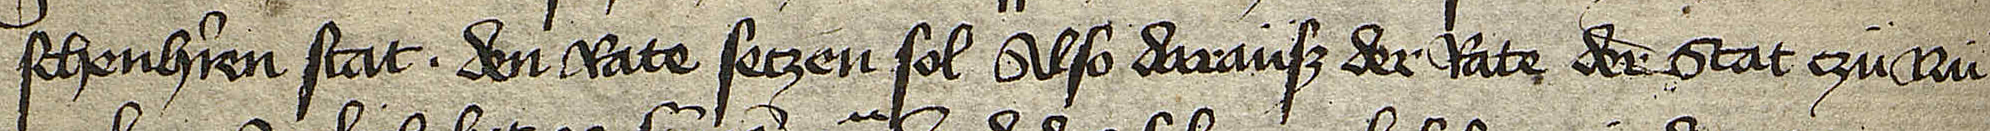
ſchenh*ren ſtat . den Rate ſecʒen ſol Alſo daraüſ* der Rate der Stat cʒü Nü
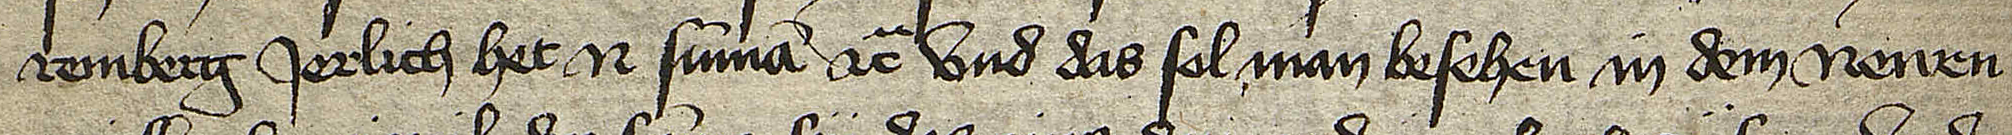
remberg Ierlich het N ſuma* ec* Vnd das ſol man beſehen in dem Newen
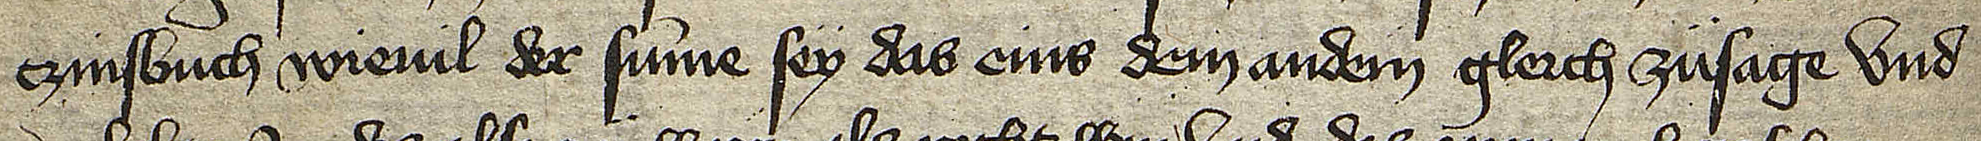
cʒinſbuch vieuil der ſume* ſey das eins dem andern gleich ʒüſage Vnd
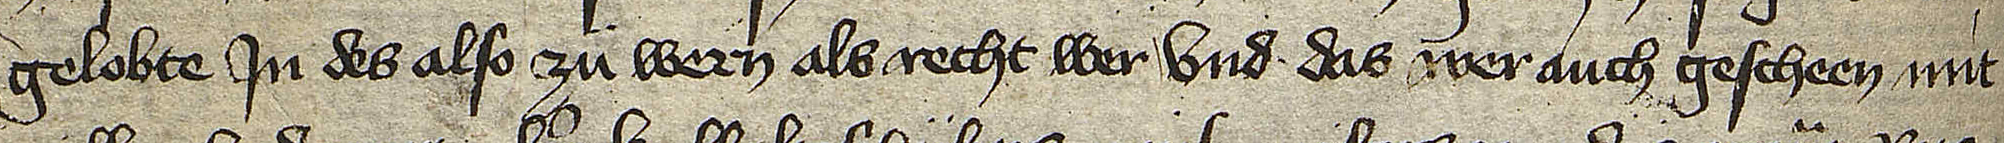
gelobte In des alſo ʒü Wern als recht Wer Vnd . das wer auch geſcheen mit
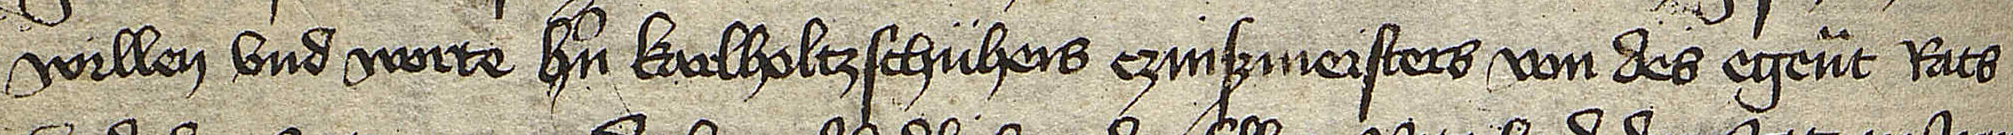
willen Vnd wirte b*n kailholcʒſchühers cʒinſ*meiſters von des egen*t Rats
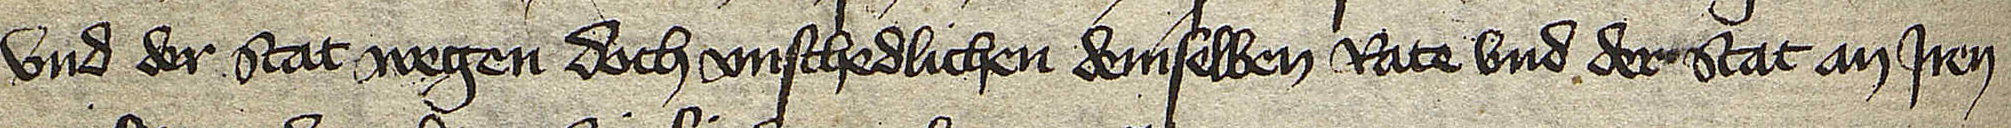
Vnd der Stat wegen doch vnſchedlichen demſelben Rate Vnd der Stat an Iren
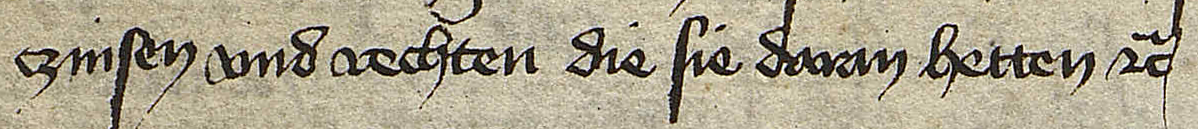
cʒinſen vnd rechten die ſie daran hetten ec*
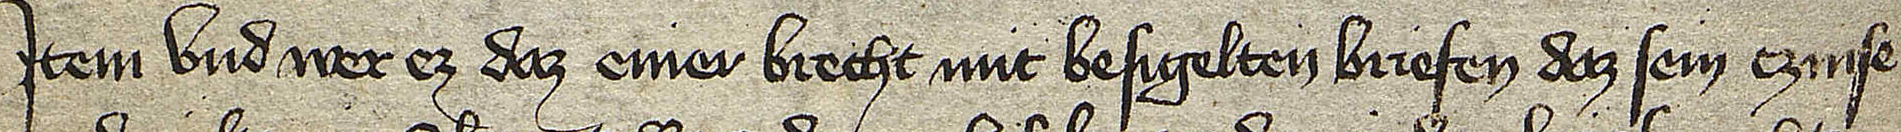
Item Vnd wer eʒ daʒ einer knecht mit beſigelten briefen daʒ ſein cʒinſe
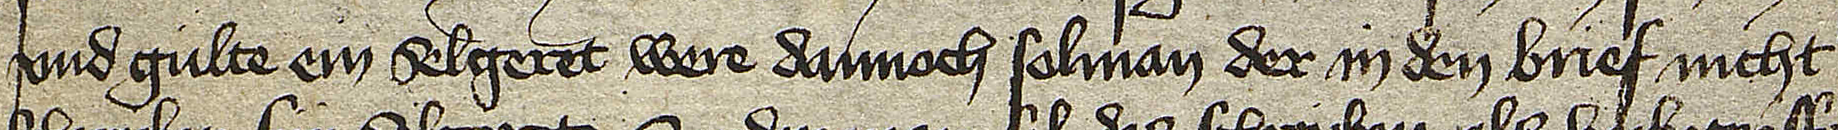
vnd gülte ein Selgeret Were dannoch ſolman der in den brief nicht
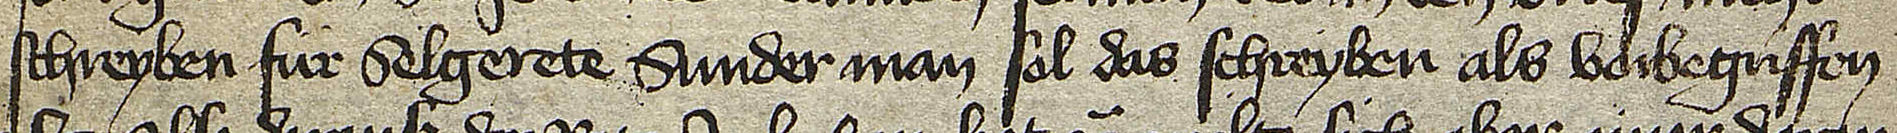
ſchreyben für Selgerete Sunder man ſol das ſchreyben als vorbegriffen
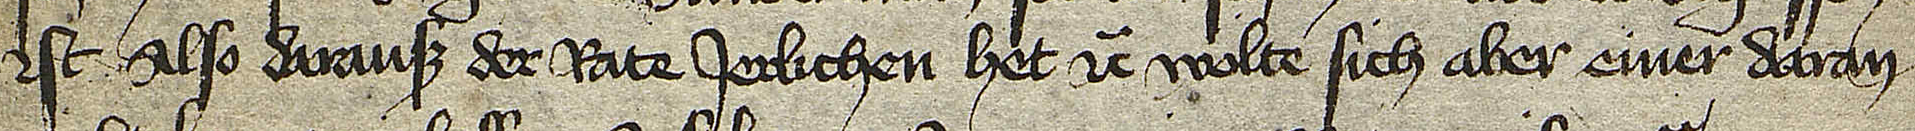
iſt alſo darau*s der Rate Ierlichen het ec* wolte ſich aber einer daran
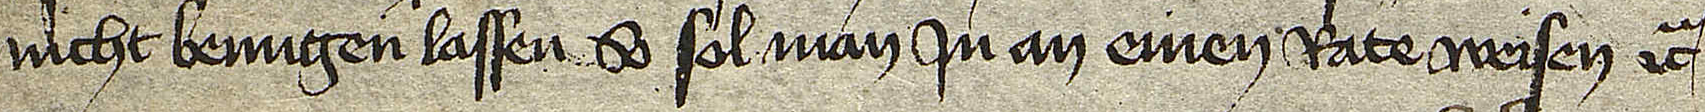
nicht benucʒen laſſen So ſol man In an einen Rate weiſen ec*
